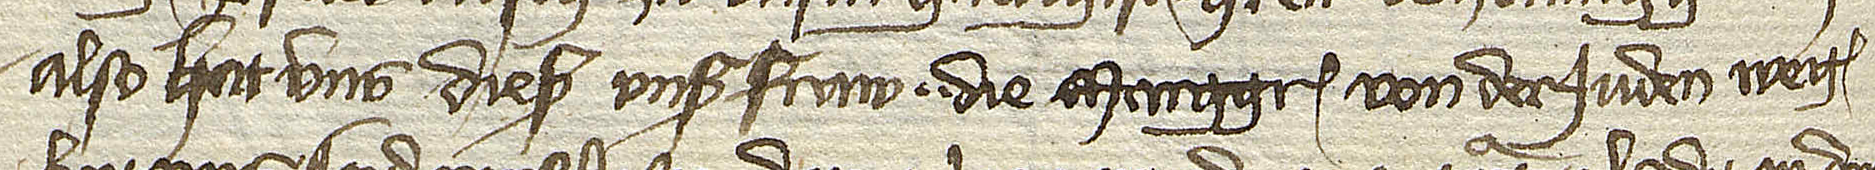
alſo hat vns dieſ* vnſ* fraw ~ die Marggr* von der Iuden weg*
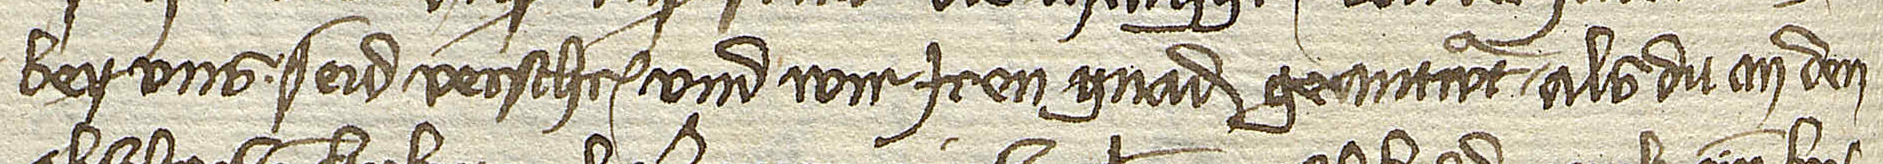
bey vns . ſeid verſchr* vnd wir Iren gnad* geantw*t / als du an den
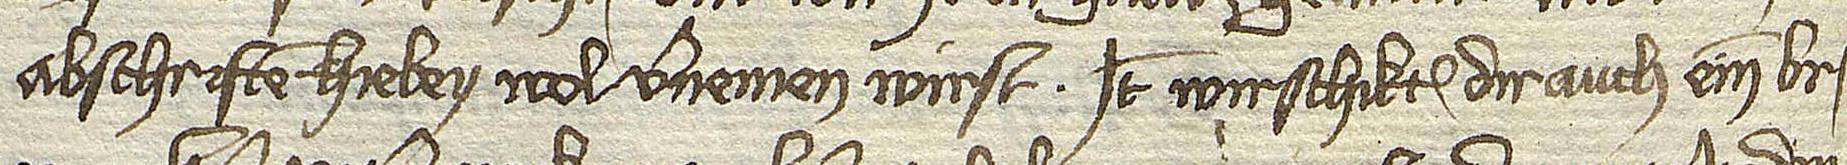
abſchrifte* hiebey wol v*nemen wirſt . It* wir ſchikt* dir auch ein* br*
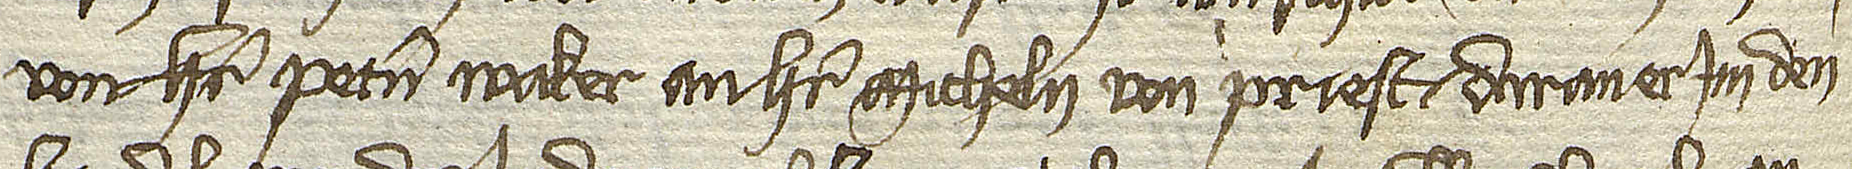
von hr* petn* waker an* hr* Micheln von prieſt / Daran er Im den
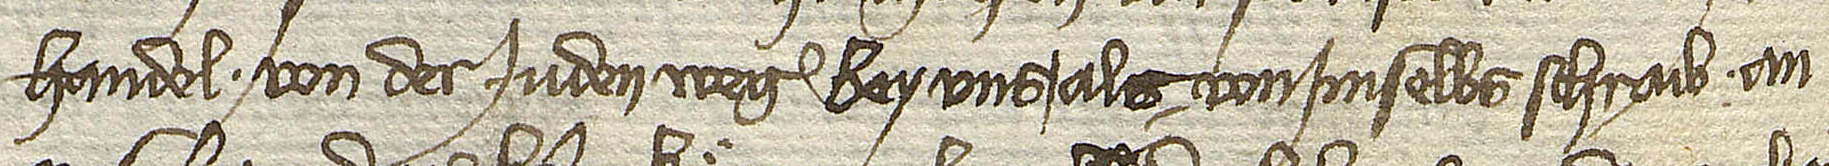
handel . von der Iuden weg* bey vns / als von Imſelbs ſchraib . an
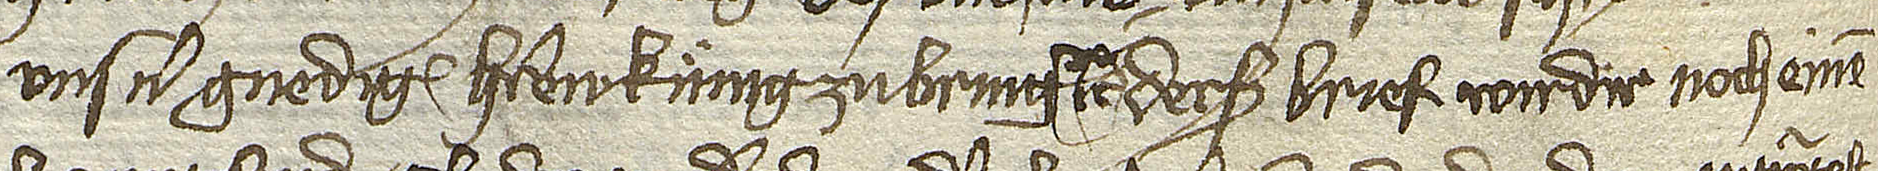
vnſn* gnedig* h*ren ~ künig ʒu bring* ec* Derſ* brief wir dir noch eine*
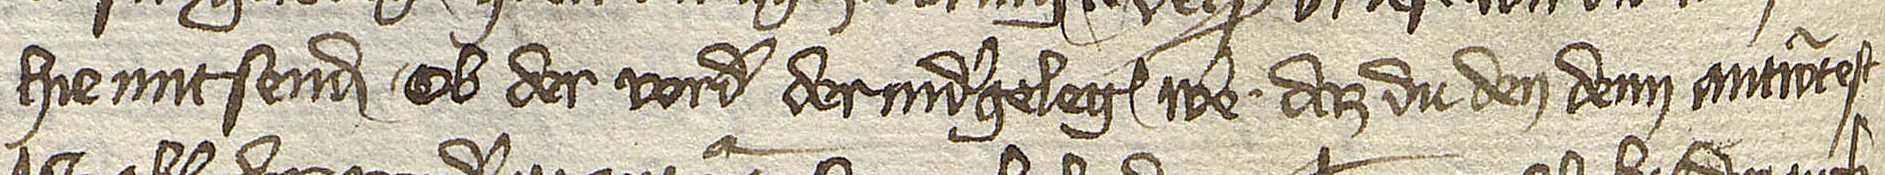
hie mit ſend* / Ob der vord* dernid* geleg* w*e . daʒ du den denn antw*teſt
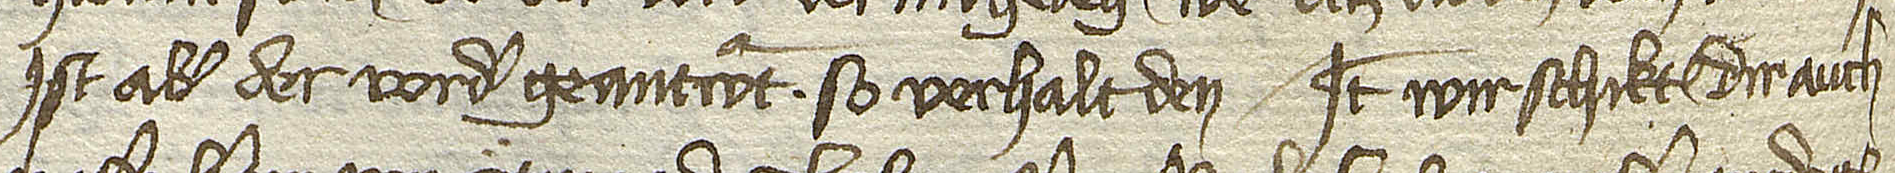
Iſt ab* der vord* geantw*t . ſo verhalt den / It* wir ſchikt* dir auch
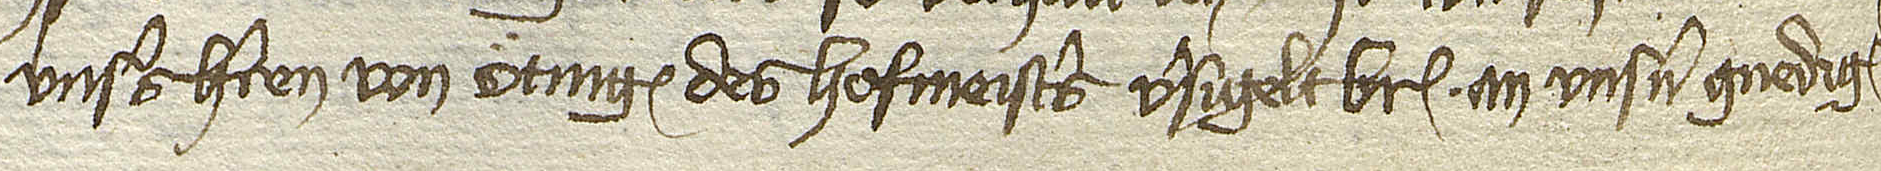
vnſ*s h*ren von Öting* des hofmeiſt*s v*ſigelt br* . an vnſn* gnedig*
